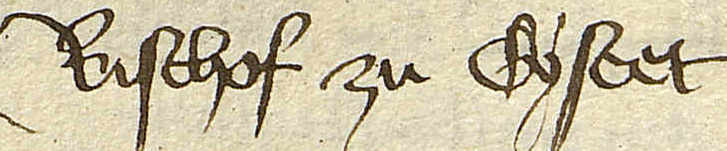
Biſchof cʒu Eyſtet
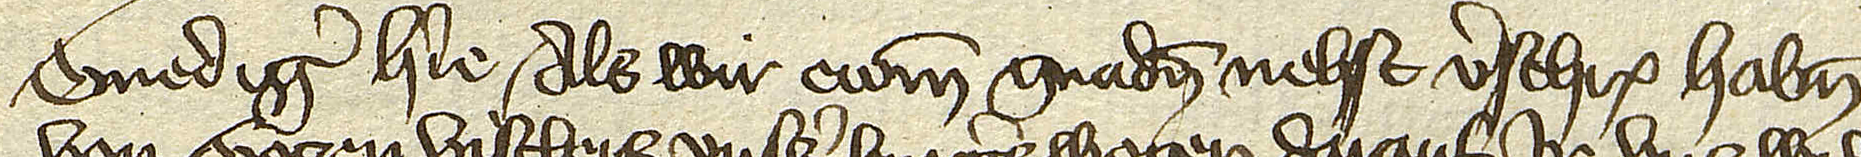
Gnedig* h*re / Als wir ewrn* gnadn* nehſt v*ſchr* habn*
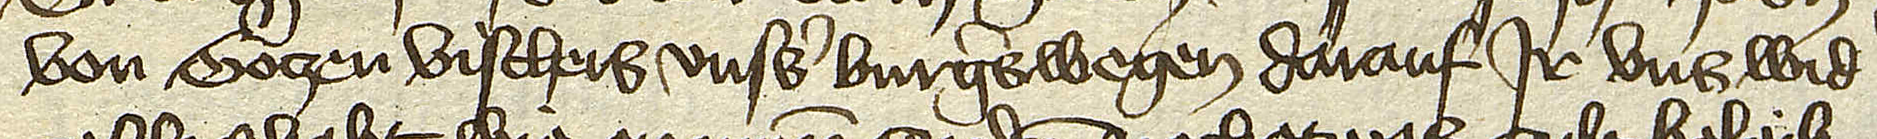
von Göcʒen viſchers vnſs* burgs* wegen darauf Ir vns wid*
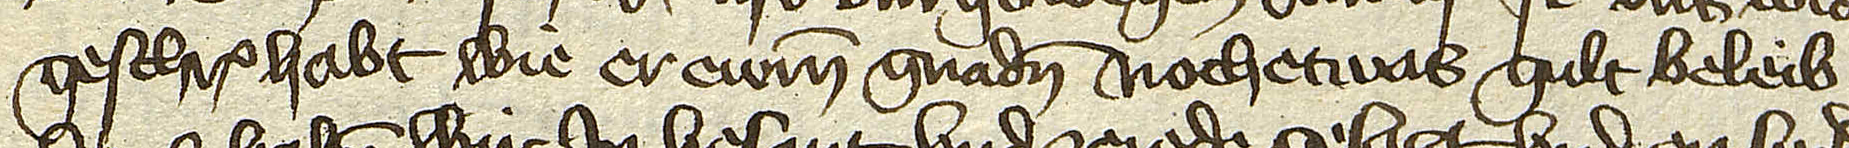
geſchr* habt wie er ewrn* gnadn* noch etwas gult beleib
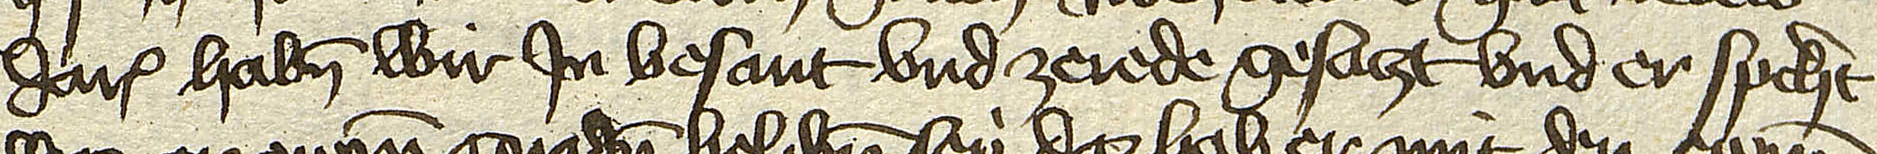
dar* habn* wir In beſant vnd cʒerede geſacʒt vnd er ſp*cht
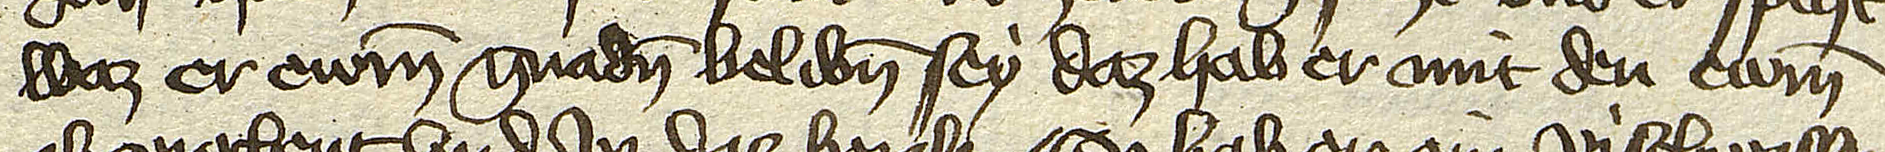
waʒ er ewrn* gnadn* belibn* ſey daʒ hab er mit den ewrn*
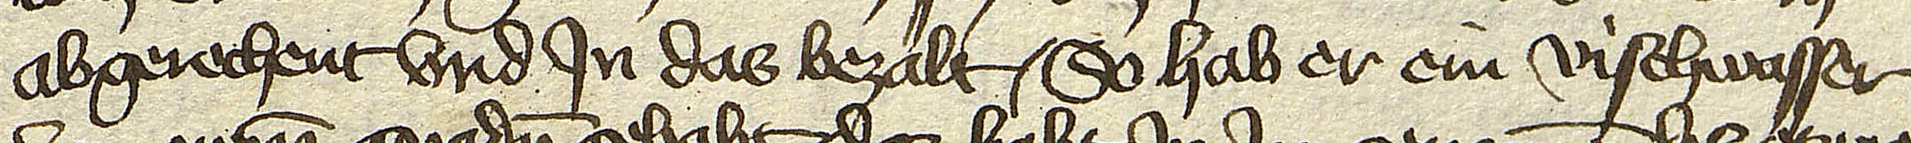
abgerechent vnd In das beʒalt / So hab er ein viſchwaſſer
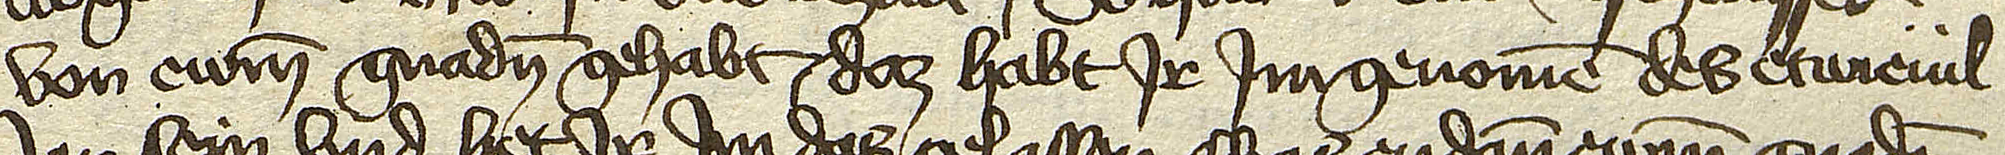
von ewrn* gnadn* gehabt / daʒ habt Ir Im genome* des etwieuil
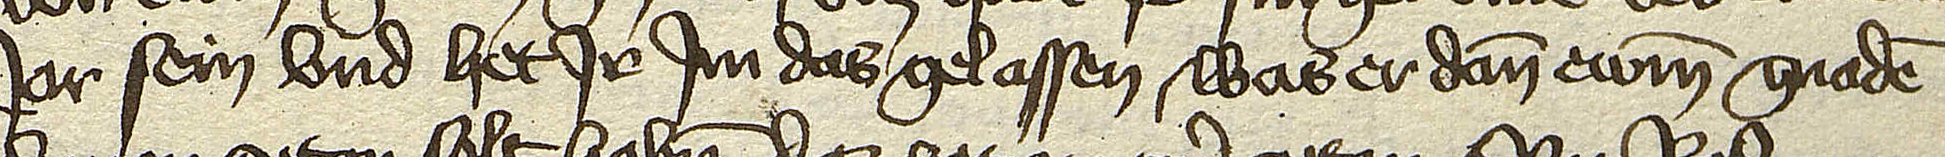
Iar ſein vnd het Ir Im das gelaſſen / was er dan* ewrn* gnade*
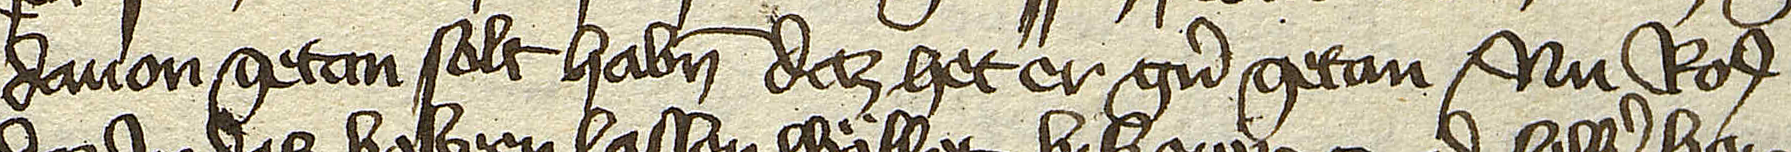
dauon getan ſolt habn* daʒ het er gn* getan / Nu Ro*
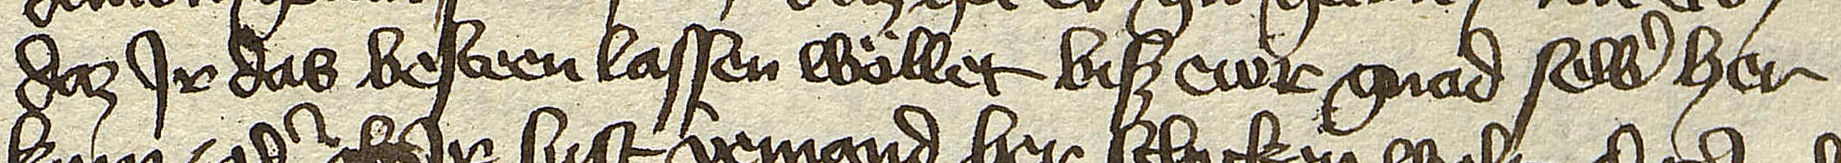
daʒ Ir das beſteen laſſen wöllet biſʒ ewr gnad ſelb* her
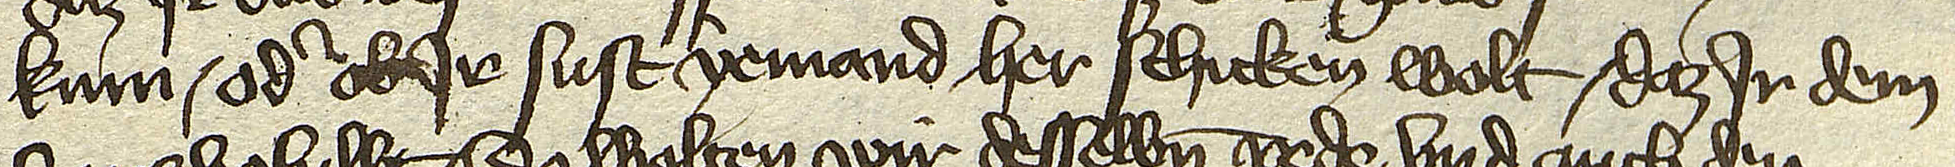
kum / od* ob Ir ſuſt yemand her ſchicken wolt / daʒ Ir dem
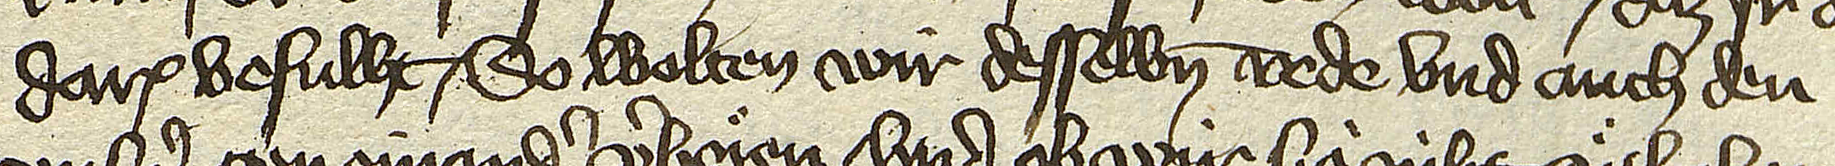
dar* befulht / So wolten wir deſſelbn* rede vnd auch den
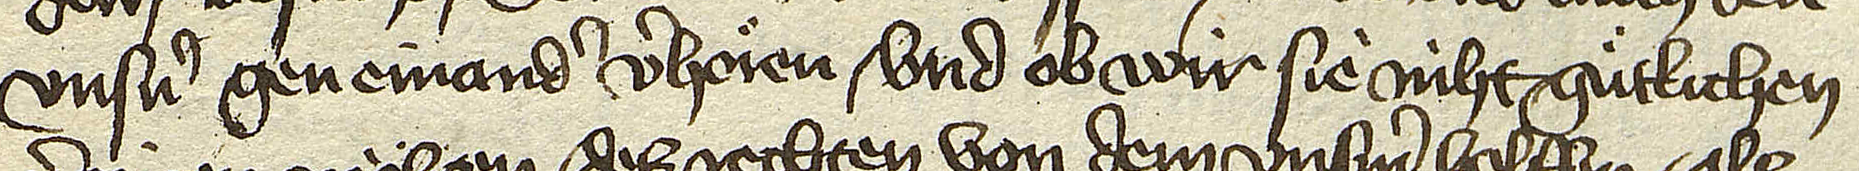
vnſn* gen einand* v*hören / vnd ob wir ſie niht gütlichen
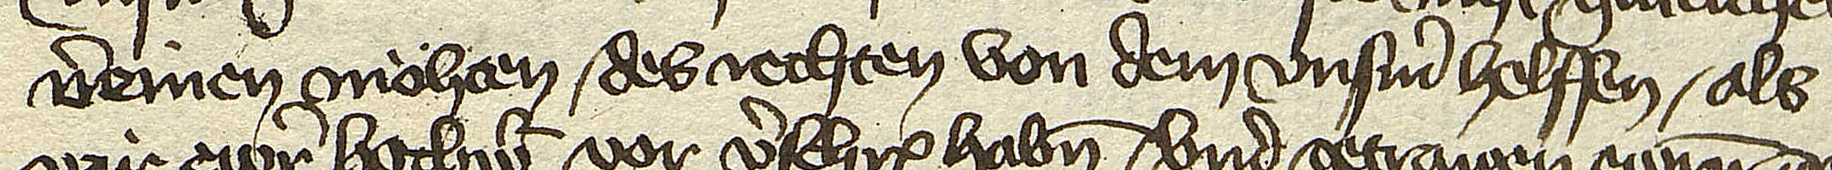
v*einen möhten / des rechten von dem vnſm* helffen / als
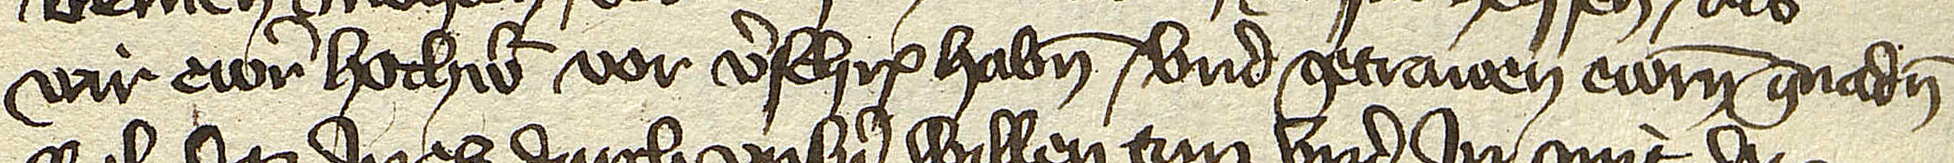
wir ewr* hochw* vor v*ſchr* habn* / vnd getrawen ewrn* gnadn*
